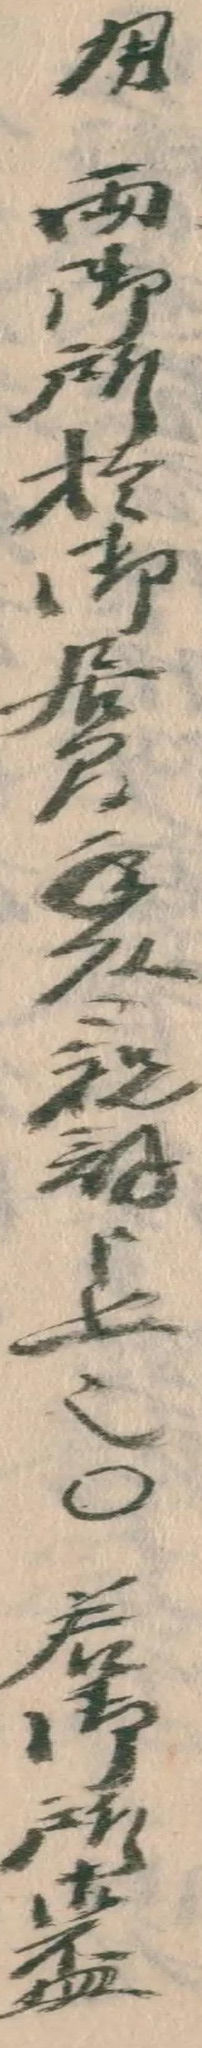用両御所於御居間年頭祝詞申上也○若御所御盃
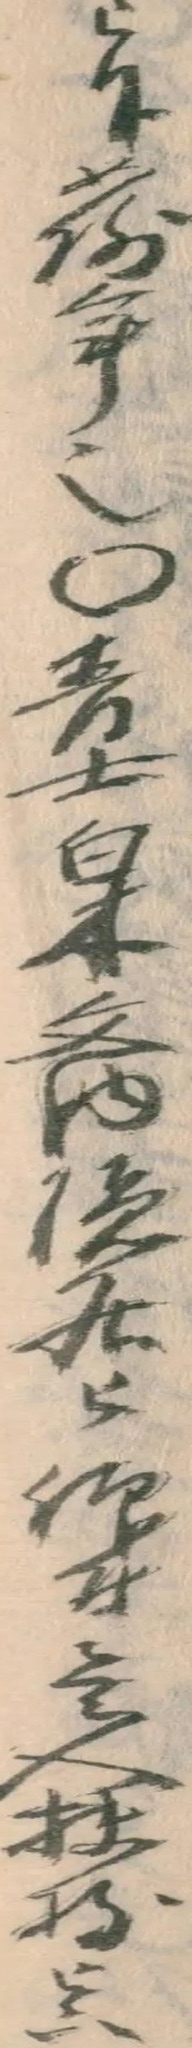被下如例年也○青士白木文内隠居被仰付壱人扶持被下
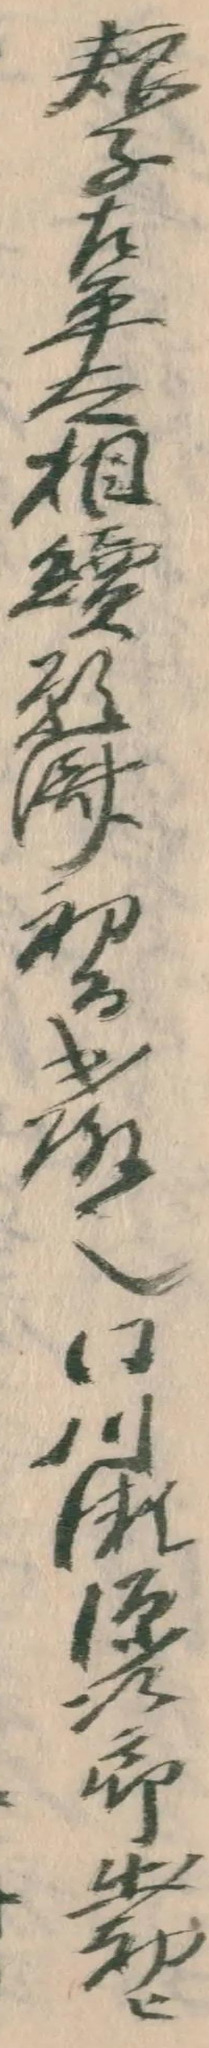養子左平太相續願済初而出殿也同川瀬源次郎出勤被
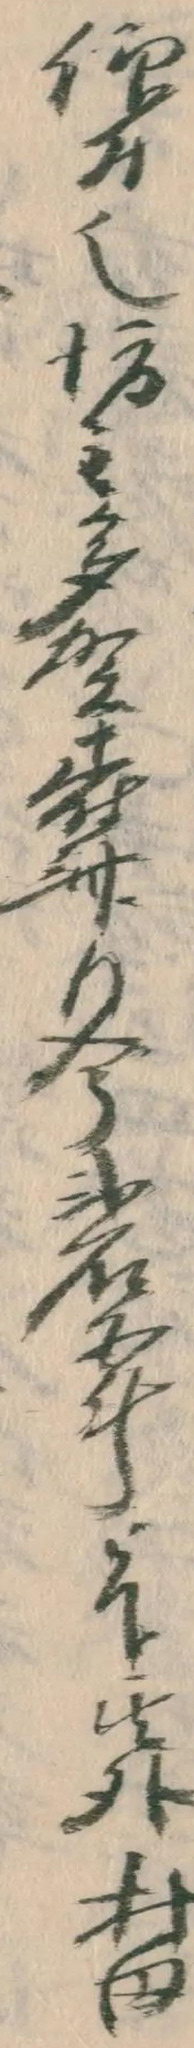仰付也坊主多賀寿斎自今弐石五斗被下其外村田
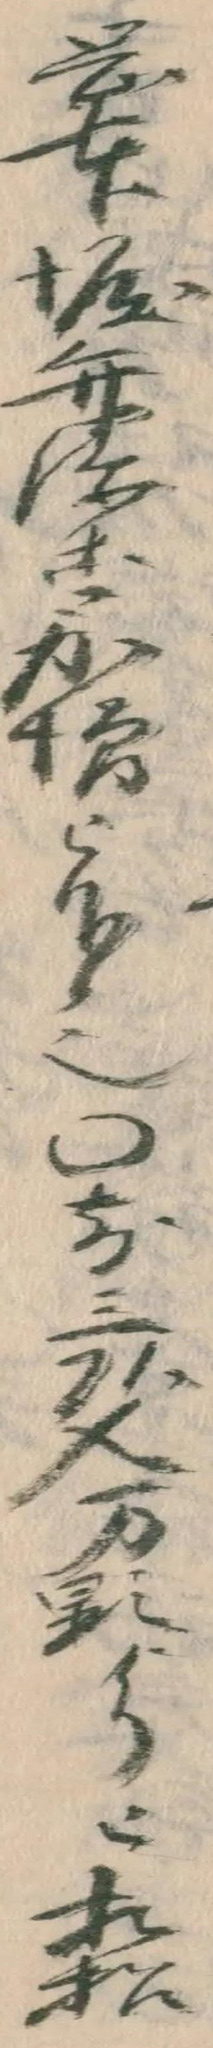岡本堀弁治等加増被下也○前三頭入万顕より被相招
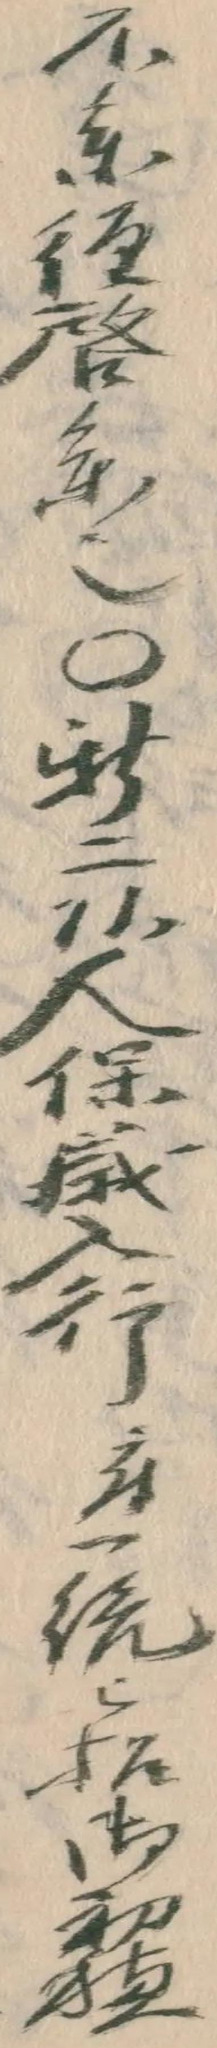不参経啓参也○新二弐人保歳入行ニ付一統被招御初穂
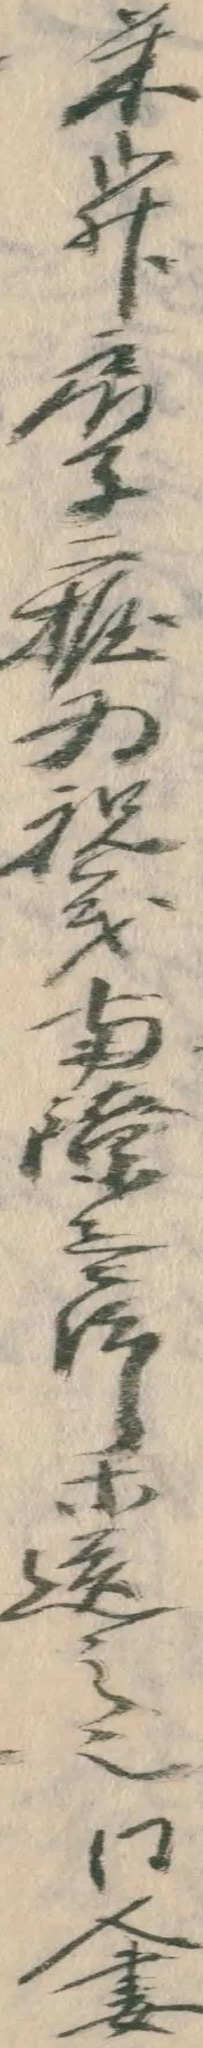米弐升扇子二握為祝義南鐐壱片等送之也同人妻
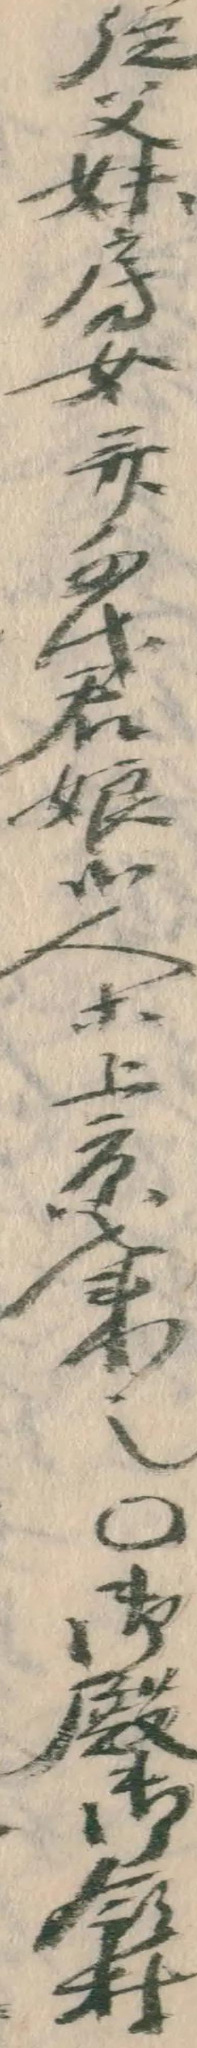従父妹房女幷千代君娘弐人等上京入来也○御殿御領分
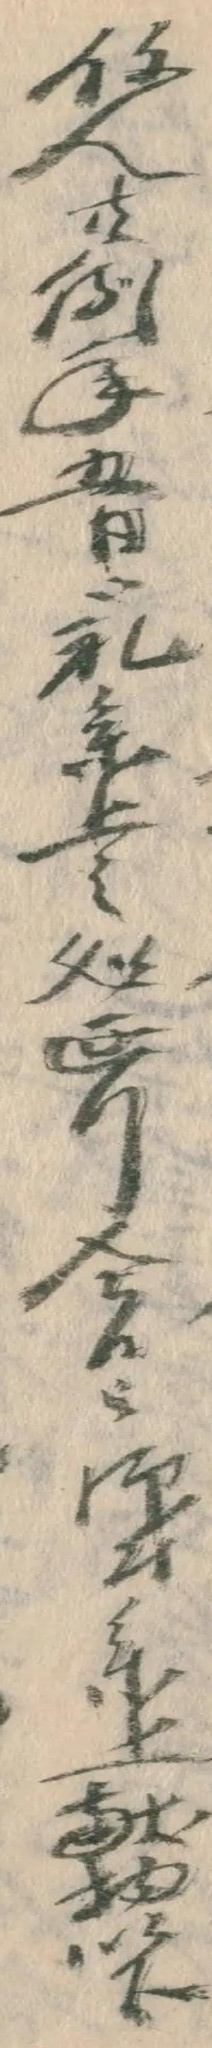役人共例年五月御礼参上之処延引今日被仰付参上献物以下
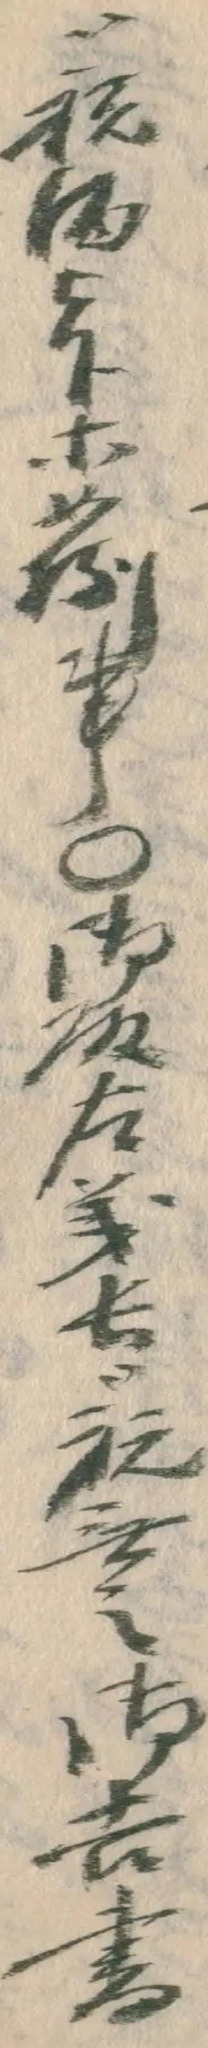御祝酒被下等如例事〇御殿左義長御祝無之御吉書
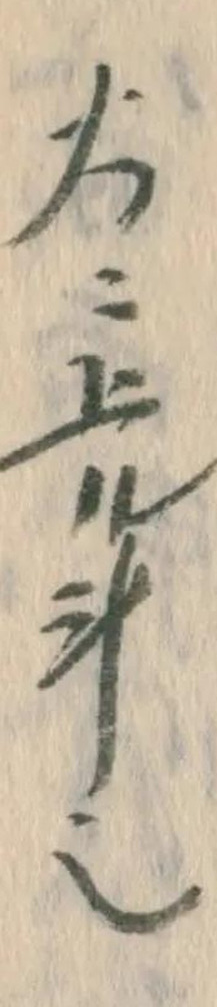火ニ上ル斗也
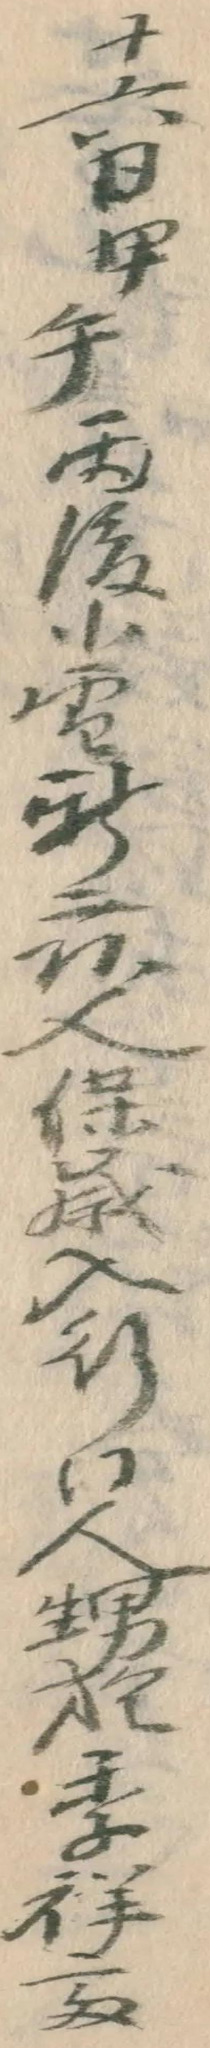十六日甲午雨後小雪新二頭人保歳入行同人甥於季祥富
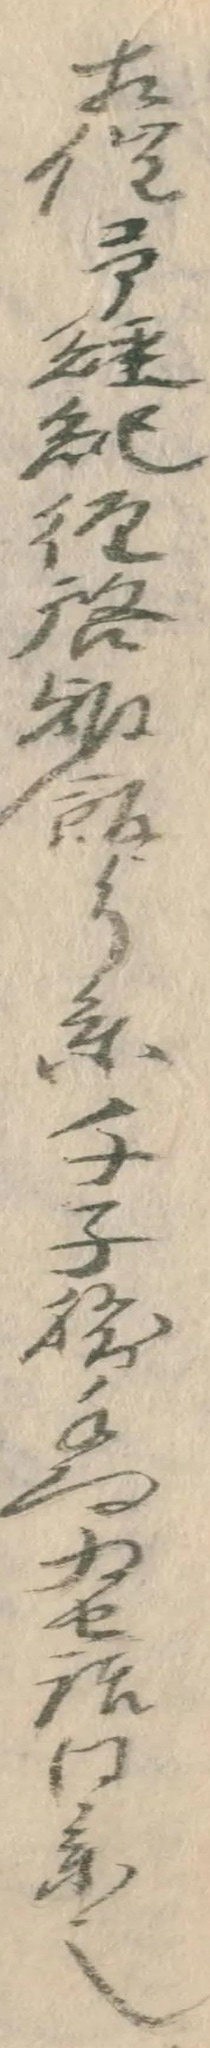相催予経紀経啓朝飯より参千子勝手向為世話同参也
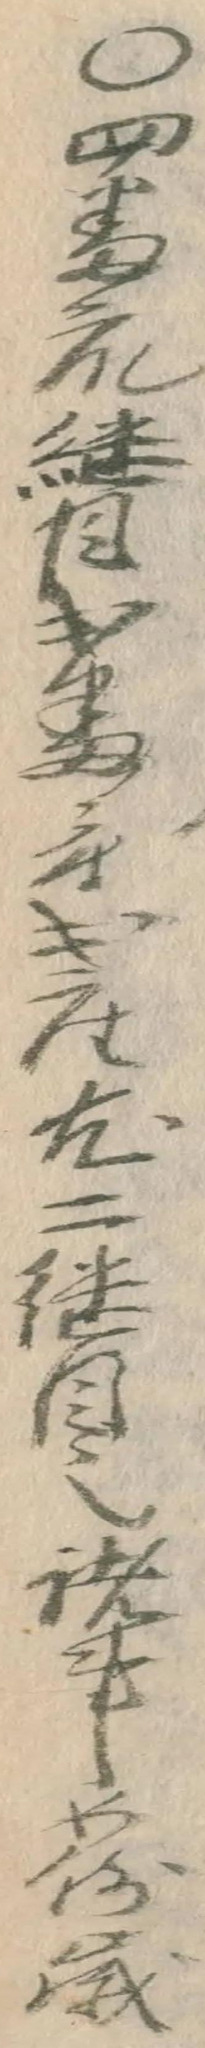○四番衆継目出番ニ付出座尤二継目也諸事如例歳

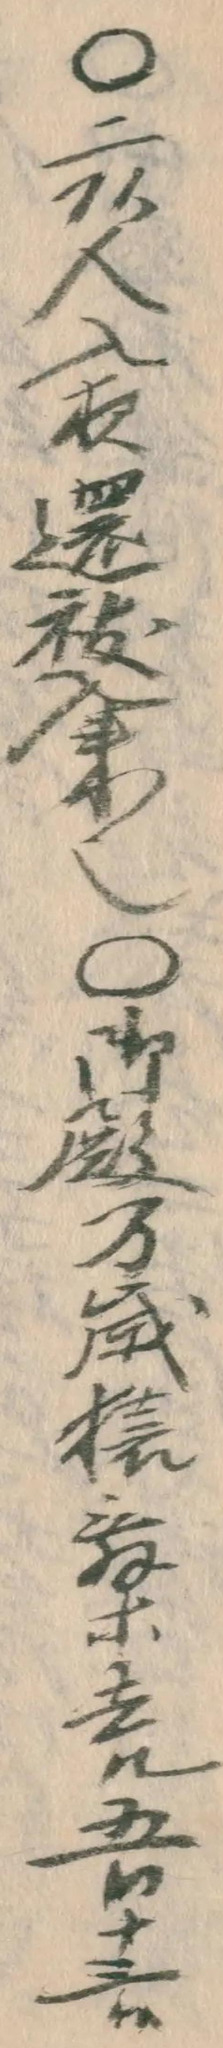○二頭人入夜還祓入来也○御殿万歳猿舞等去ル五日十三日
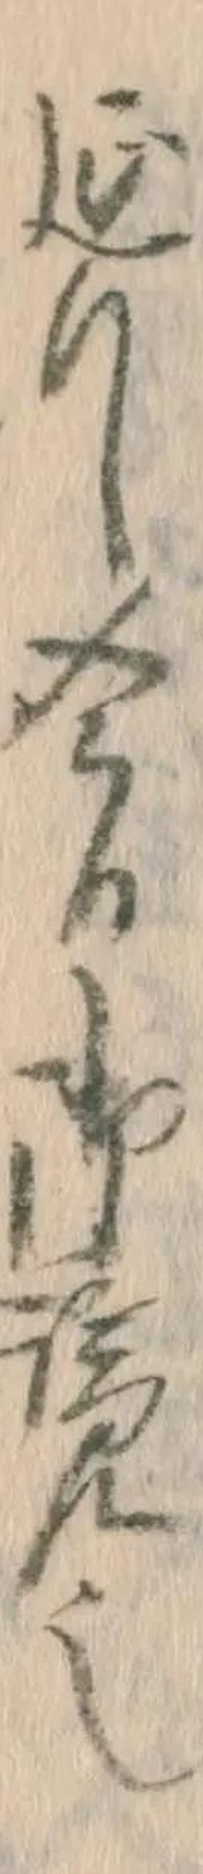延引今日御覧也
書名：賀茂社記録. 第67冊
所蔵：国立国会図書館 National Diet Library, JAPAN
